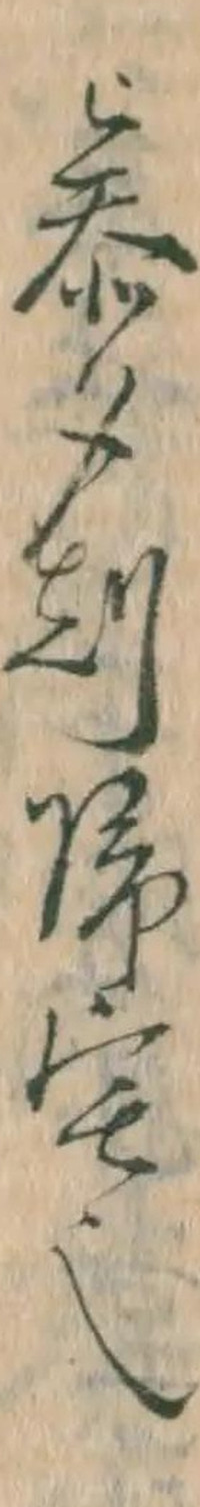参夕刻帰宅也
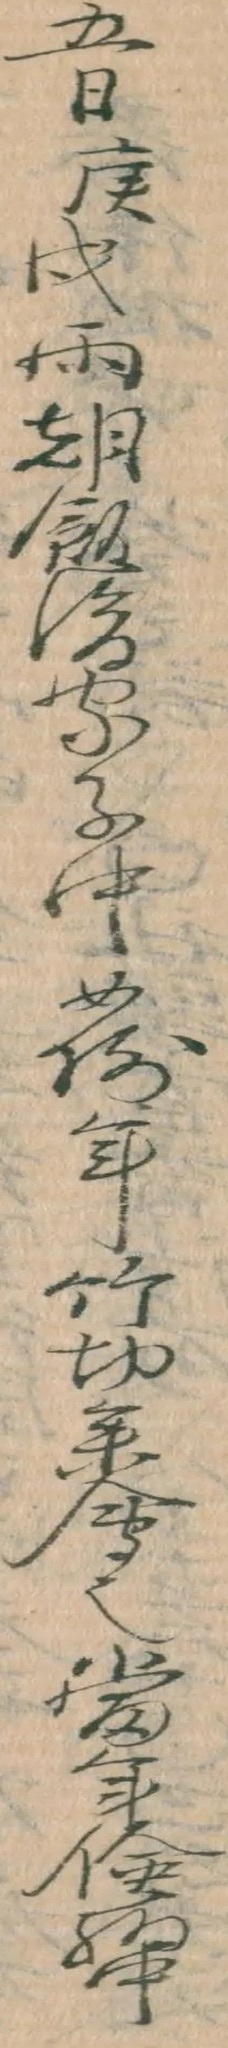五日庚戌雨朝飯後家子中如例年竹切参會也當年倹約中
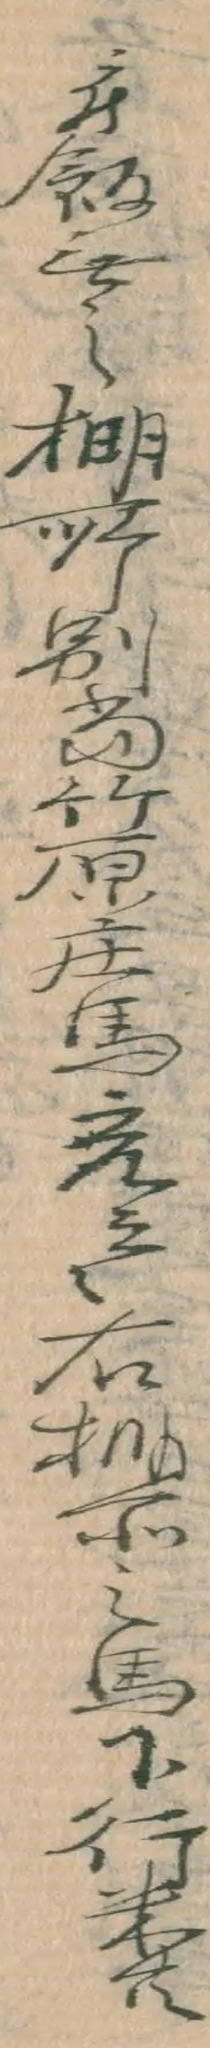ニ付飯無之棚所別當竹原庄馬充云々右棚所之馬下行米共
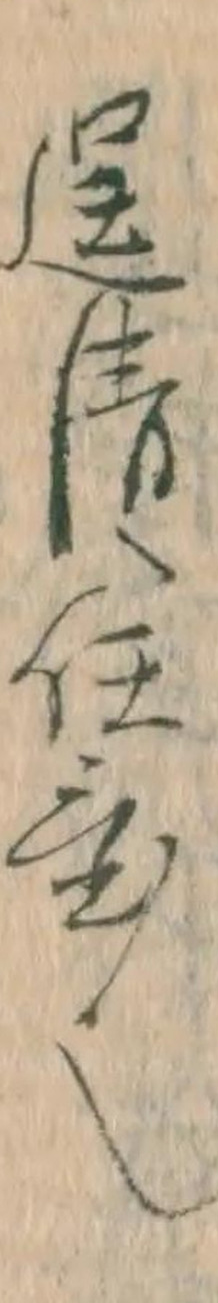逞清へ任置也
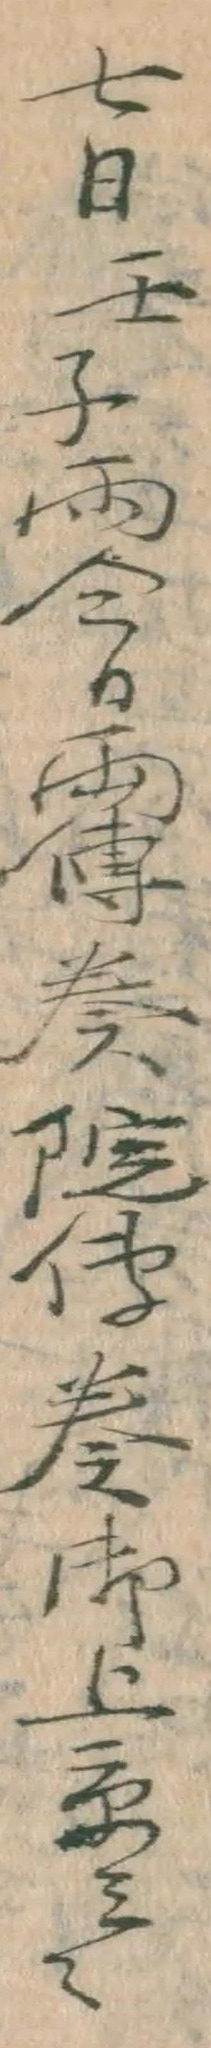七日壬子雨今日両傳奏院傳奏御上京云々
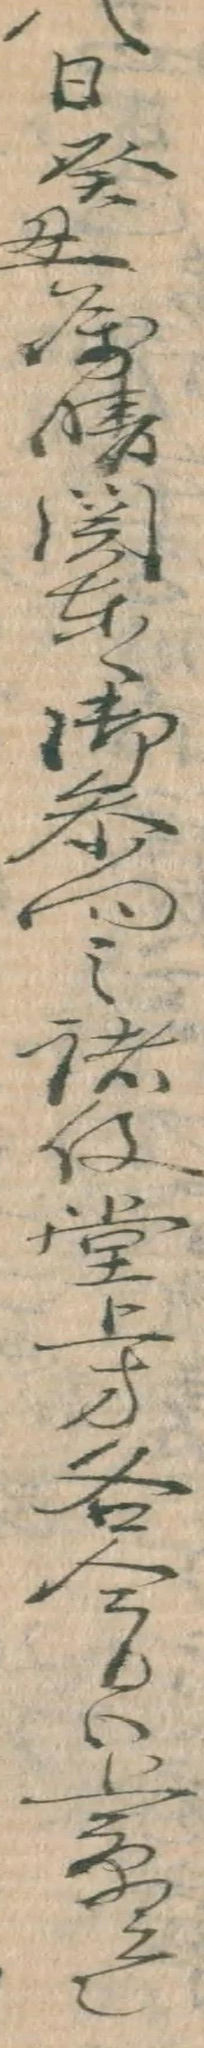八日癸丑薄晴関東へ御参向之諸役堂上方各今日御上京云々
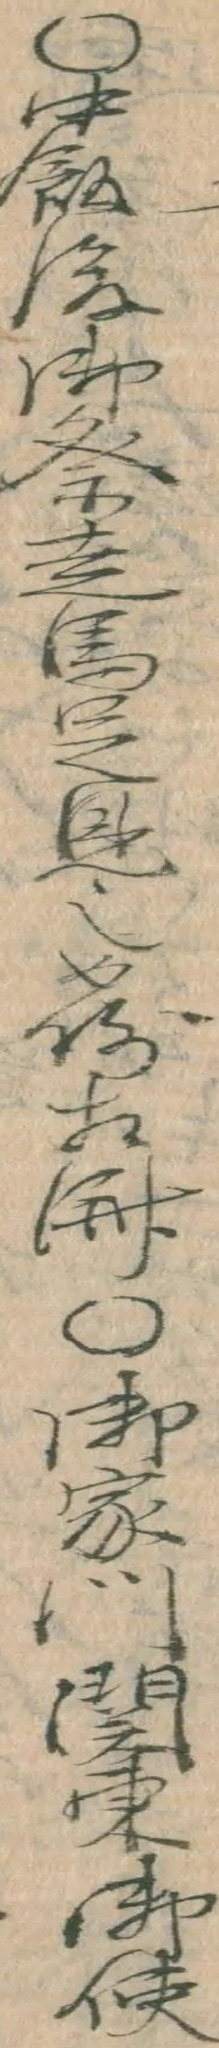○中飯後御祭走馬足見也如例相済〇御家門関東御使
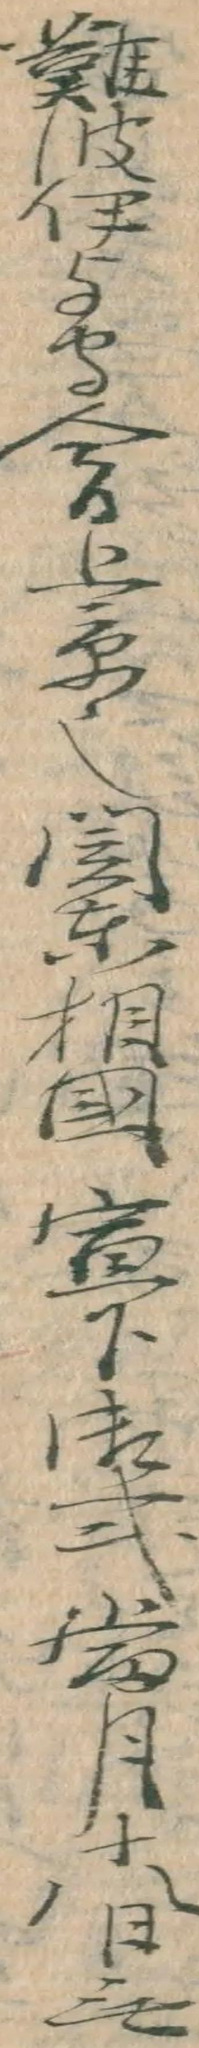難波伊与守今日上京也関東相國宣下御式當月十八日無
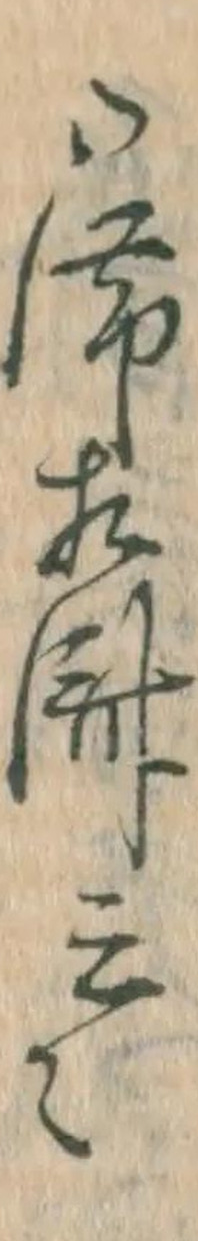御滞相済云々
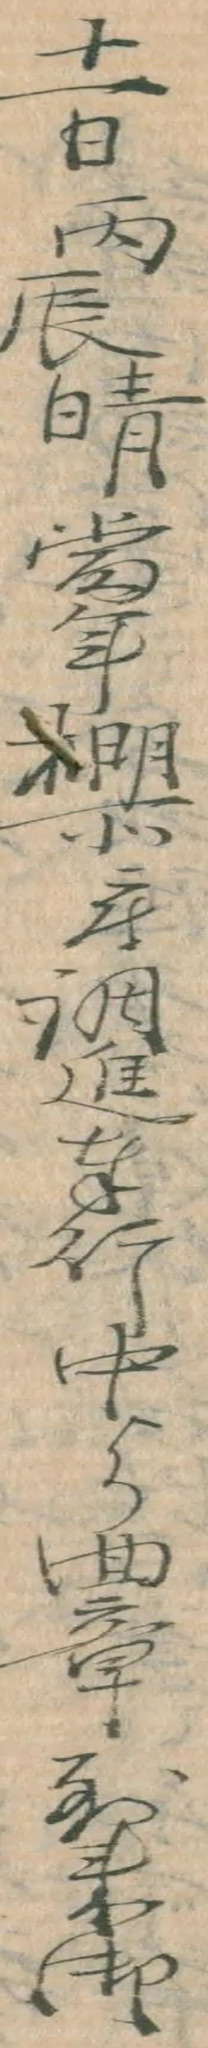十一日丙辰晴當年棚所ニ付調進奉行中より回章到来御
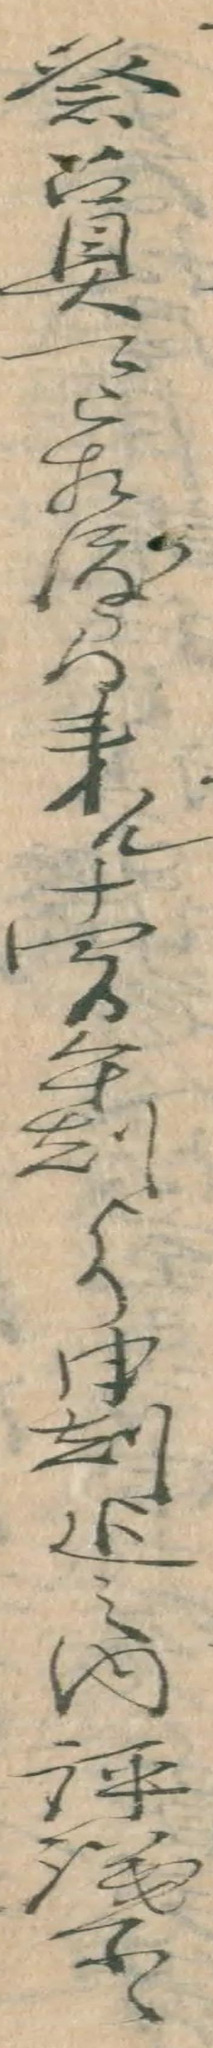祭召具可被相渡間来ル十四日午刻より申刻迄之内評議所へ
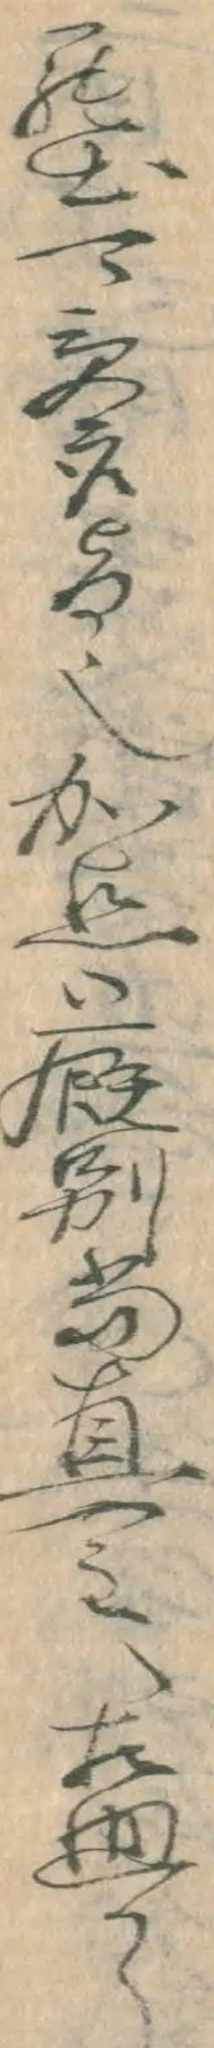罷出可受取旨也加迄御厩別當直一之へ相廻了

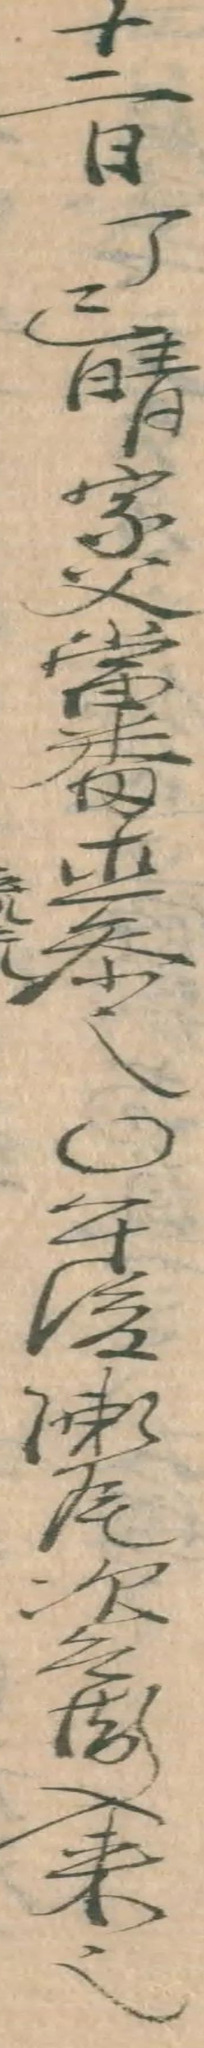十二日丁巳晴家父當番直参也○午後瀬尾次兵衛入来也
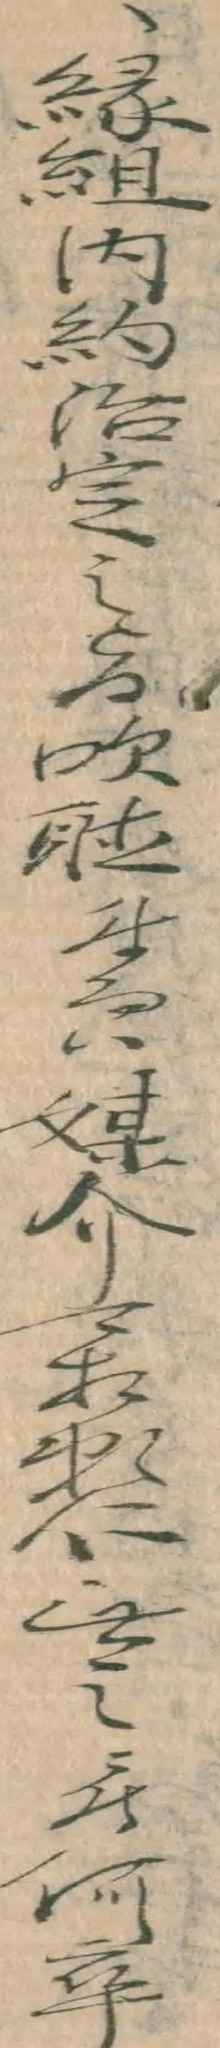縁組内約治定之旨吹聴付而ハ媒介可相頼仁無之ニ付何卒
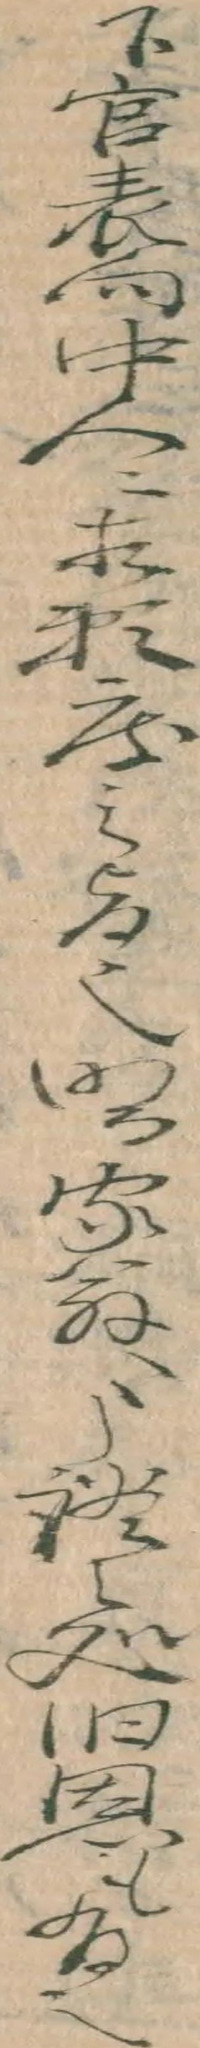下官表向中人ニ相頼度之旨也仍而家翁へ申談候処旧恩も有之
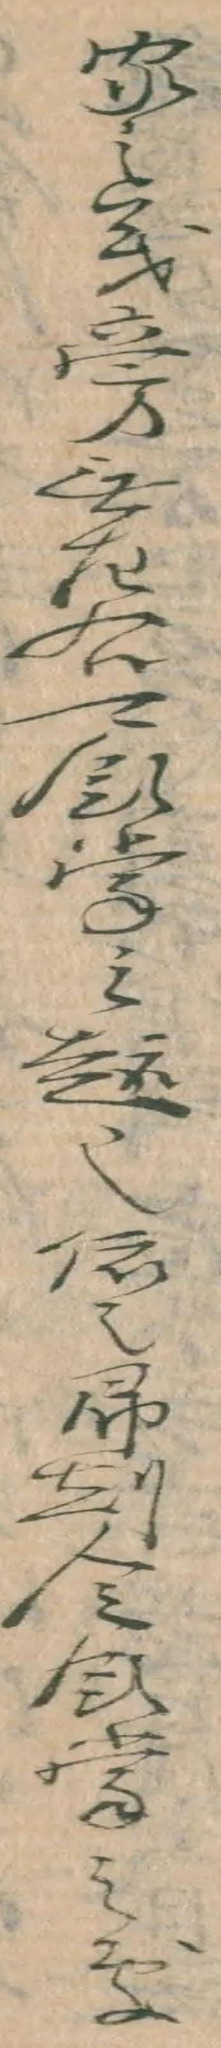家之義旁無左右可領掌之趣也依之即刻令臥掌之處
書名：賀茂社記録. 第65冊
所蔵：国立国会図書館 National Diet Library, JAPAN
